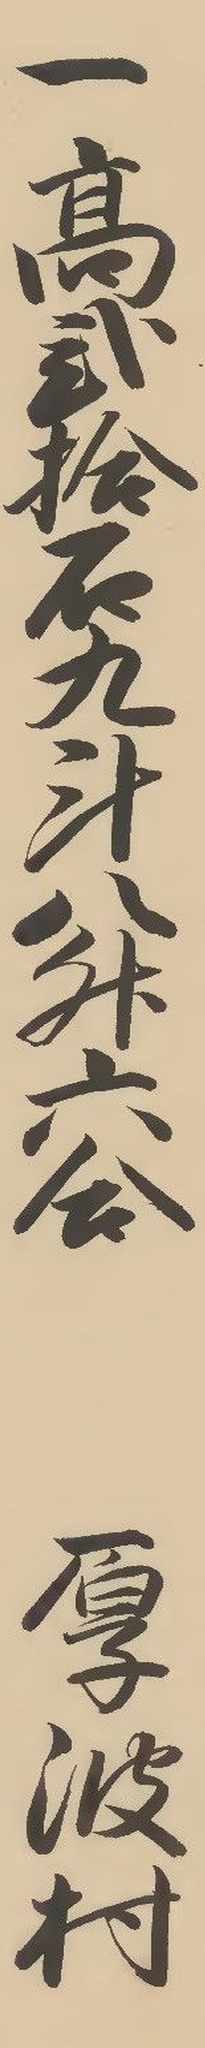一高弐拾石九斗八升六合厚波村
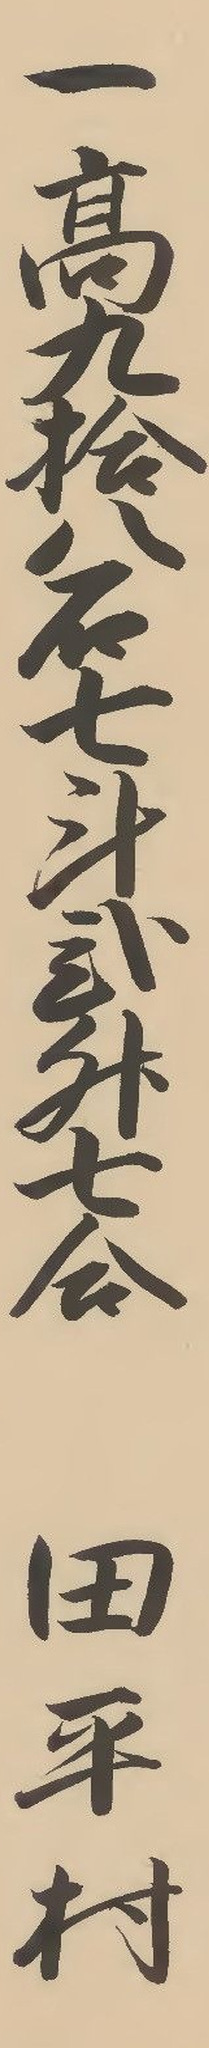一高九拾八石七斗弐升七合田平村
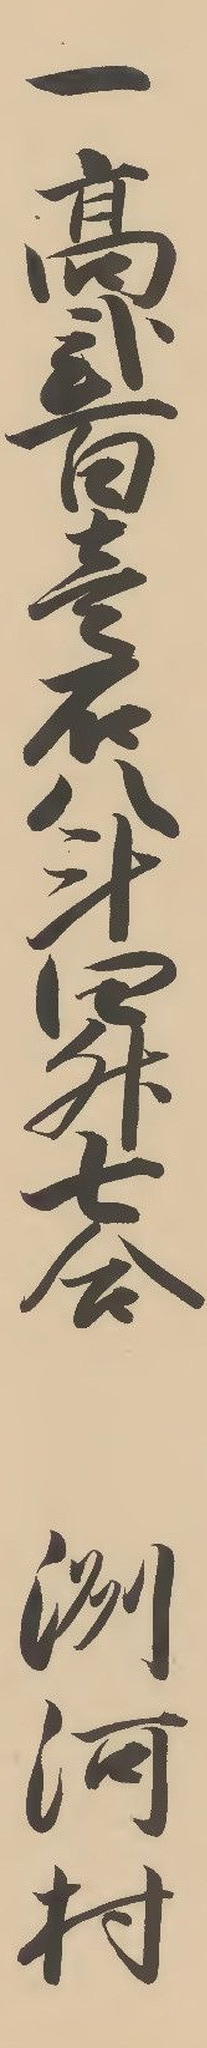一高弐百壱石八斗四升七合洲河村
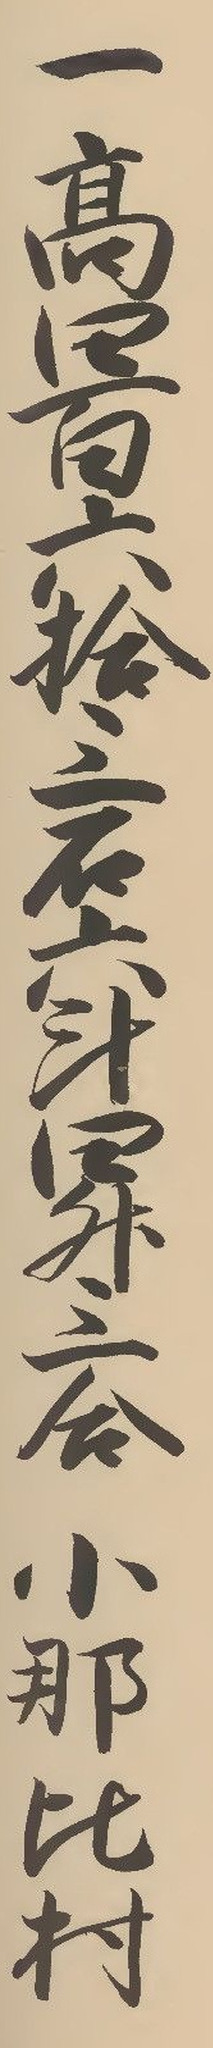一高四百六拾三石六斗四升三合小那比村
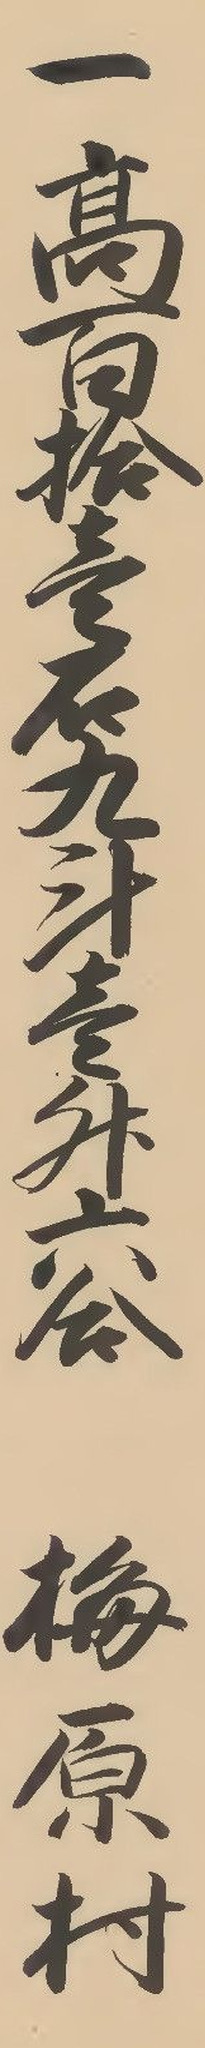一高百拾壱石九斗壱升六合梅原村
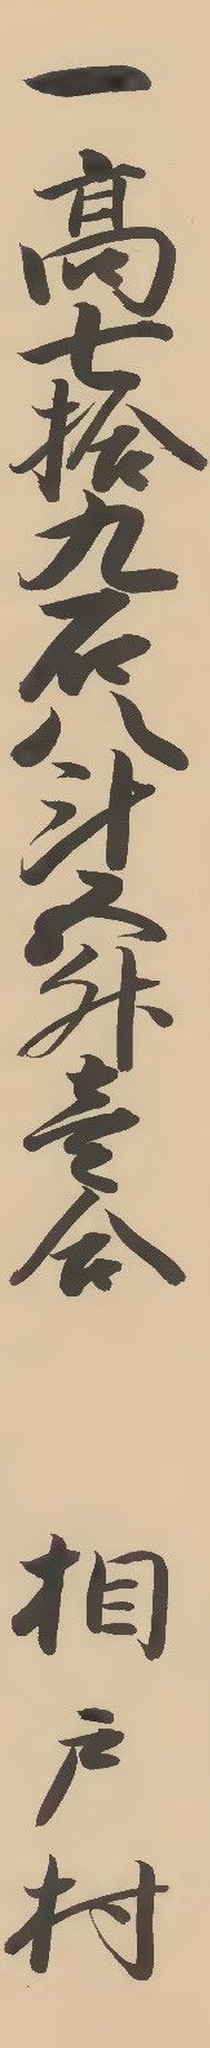一高七拾九石八斗五升壱合相戸村

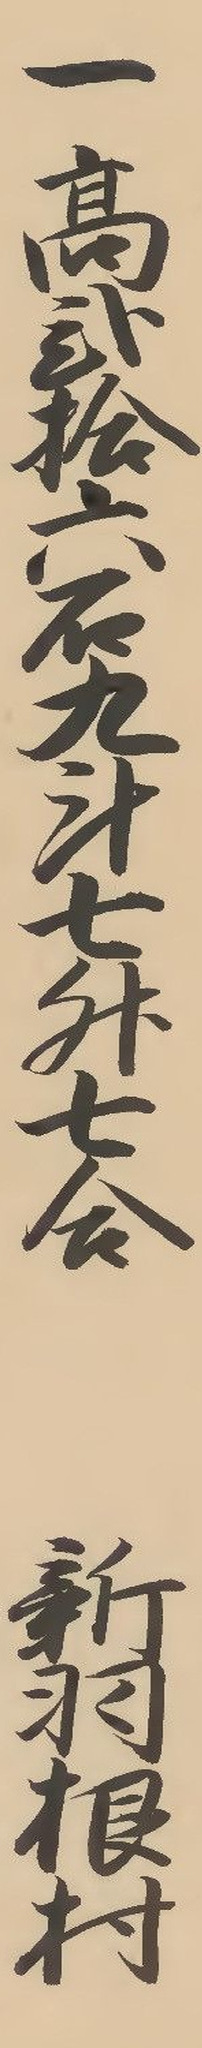一高弐拾六石九斗七升七合新羽根村
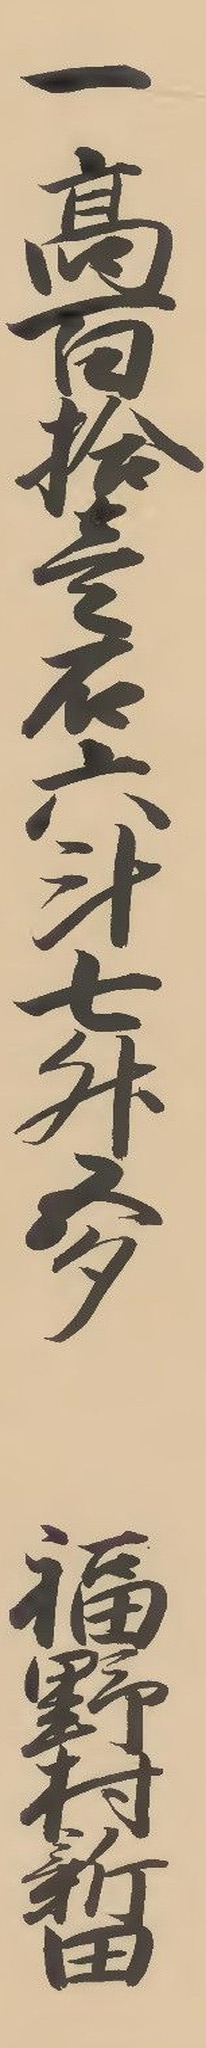一高百拾壱石六斗七升五勺福野村新田
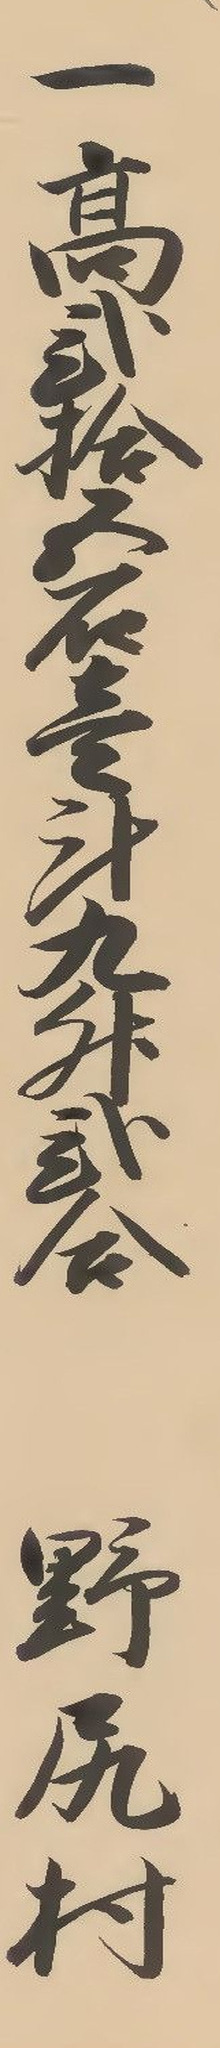一高弐拾五石壱斗九升弐合野尻村
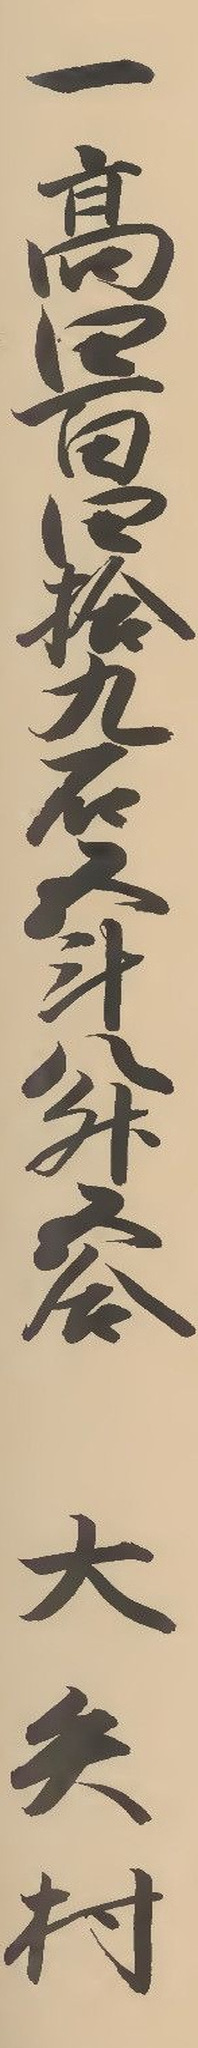一高四百四拾九石五斗八升五合大矢村
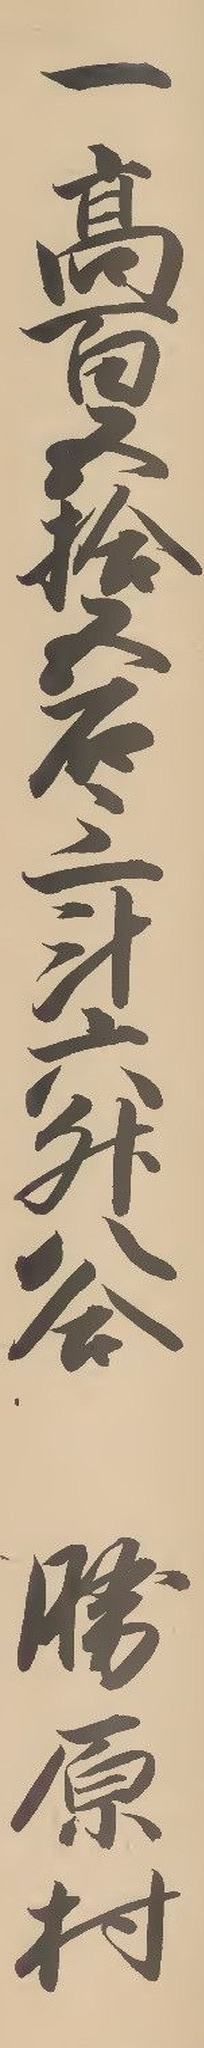一高百五拾五石三斗六升八合勝原村
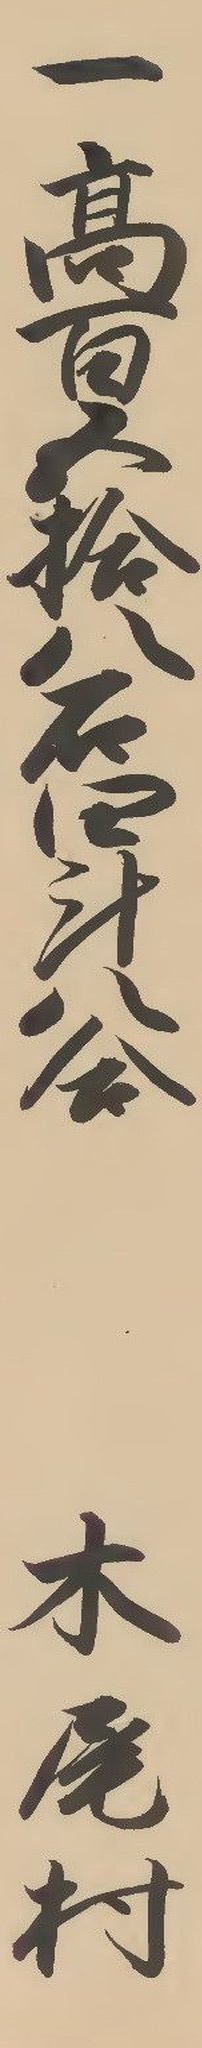一高百五拾八石四斗八合木尾村
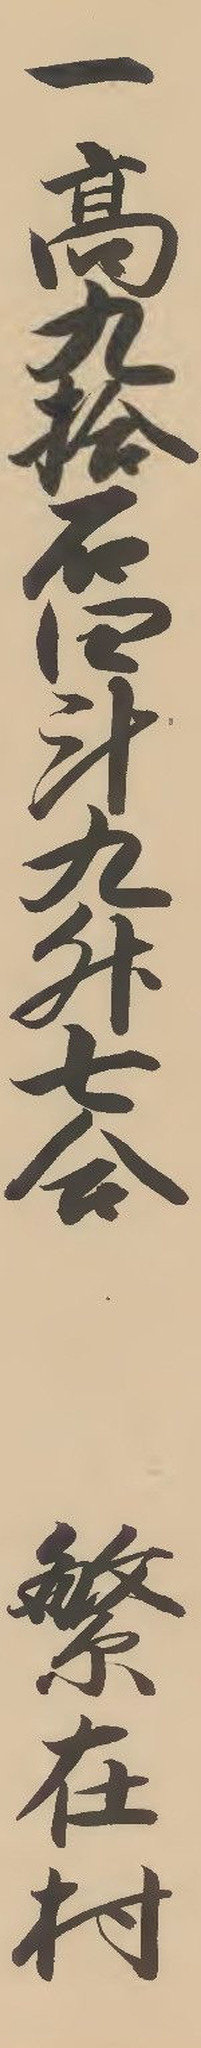一高九拾石四斗九升七合繁在村
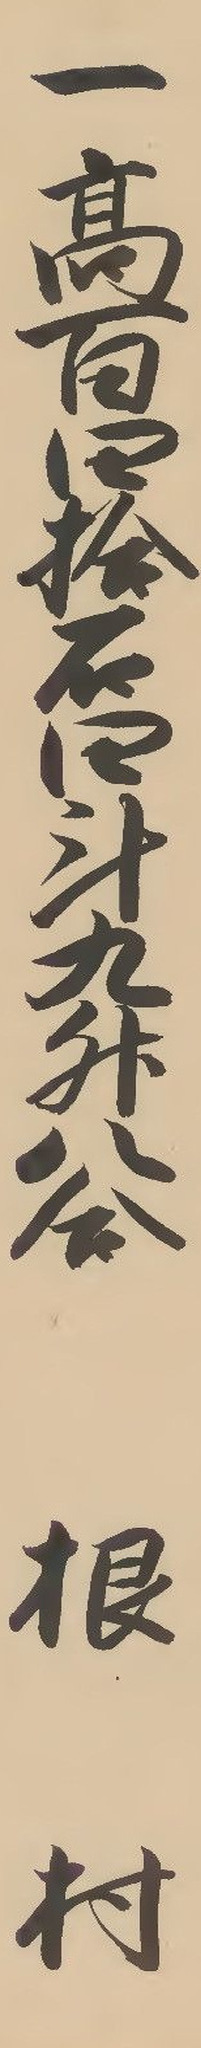一高百四拾石四斗九升八合根村

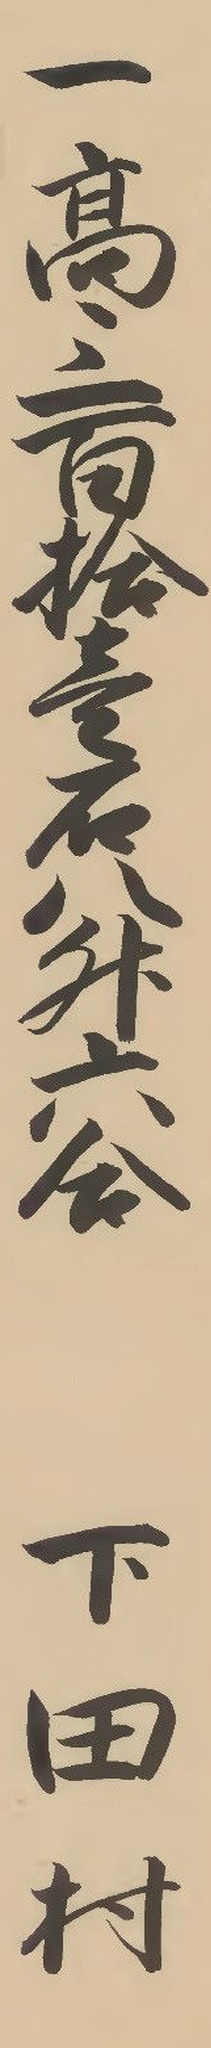一高三百拾壱石八升六合下田村
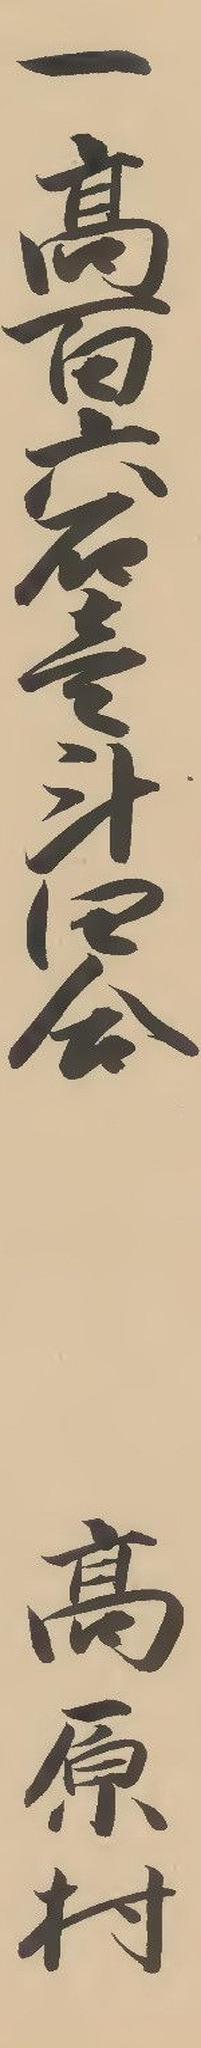一高百六石壱斗四合高原村
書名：美濃国郷帳
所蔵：国立公文書館 National Archives of Japan
